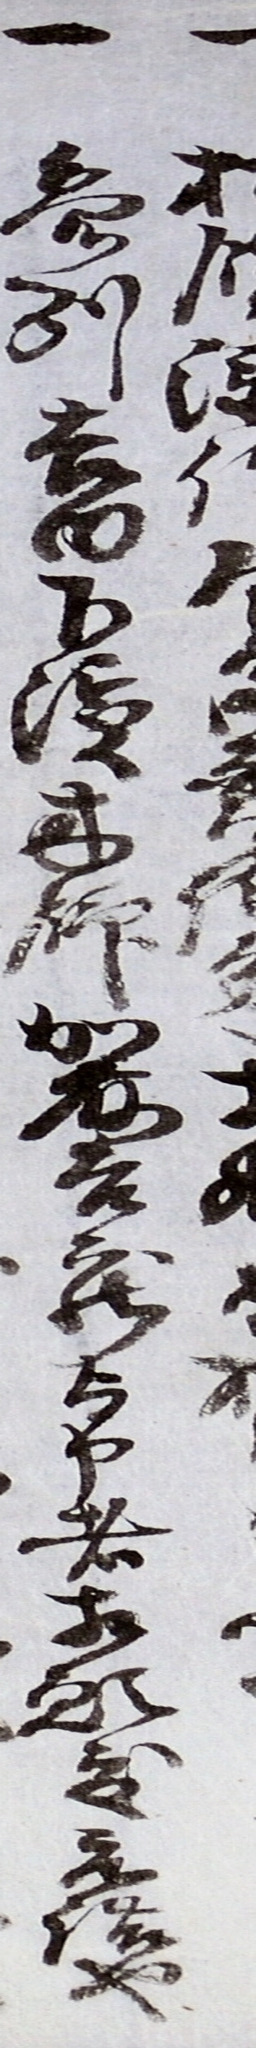一参州吉田下浜木師加藤吉蔵与申者相願度や
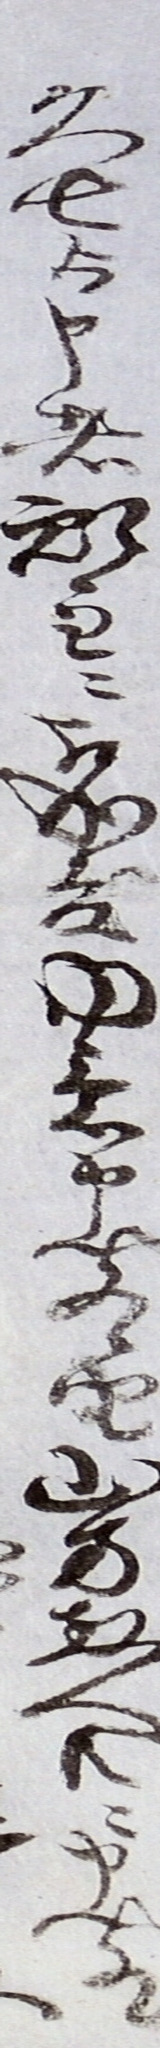久七与申者願主ニ相成度内意申聞候由山方両人共ニ申聞候
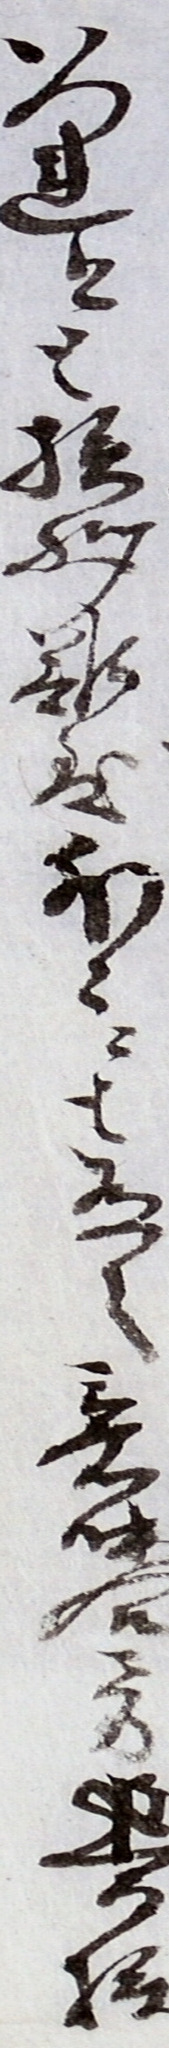いつれとも挨拶難致外々ニも有之意味合旁追而挨
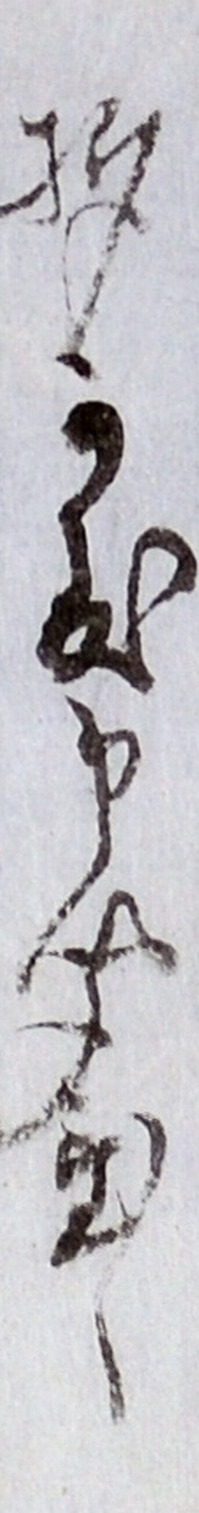拶可致申聞置候
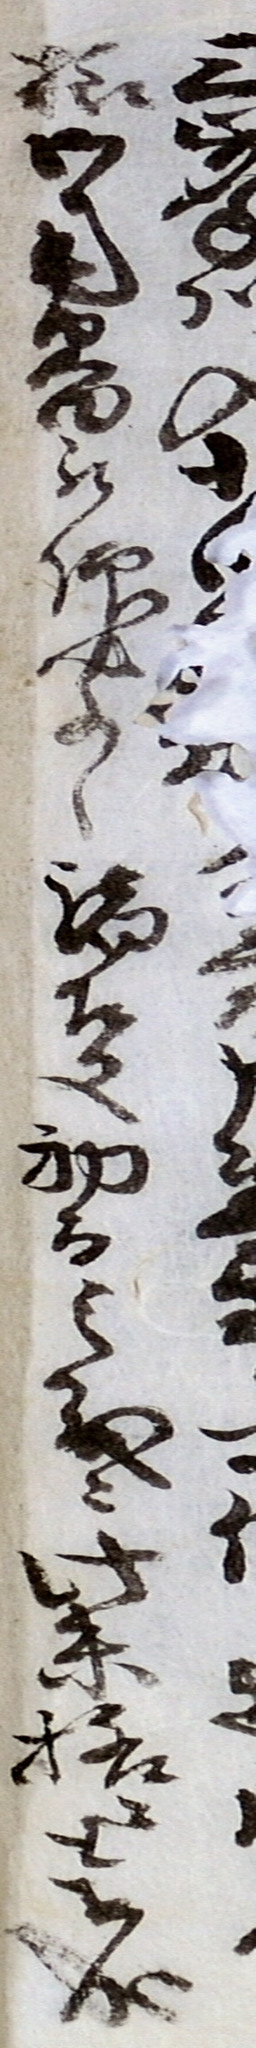様御用番被仰聞候諸事初而之義ニ此格ニも相成
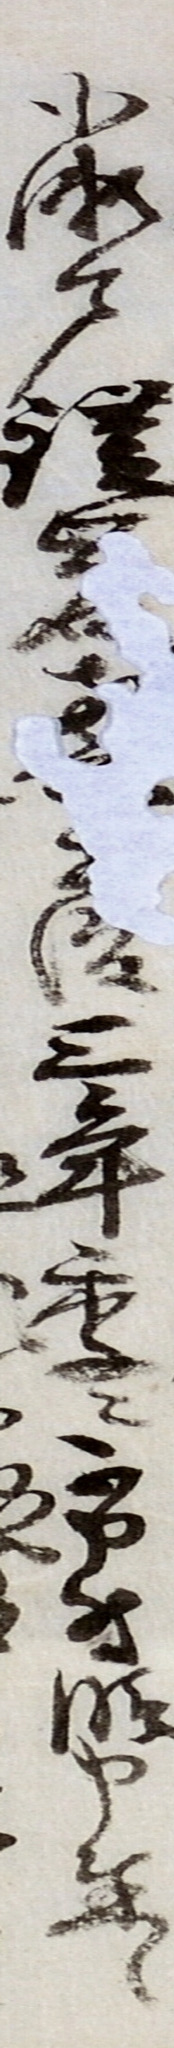小瀬戸鎧岩両所後三年季ニ可申付段申達候
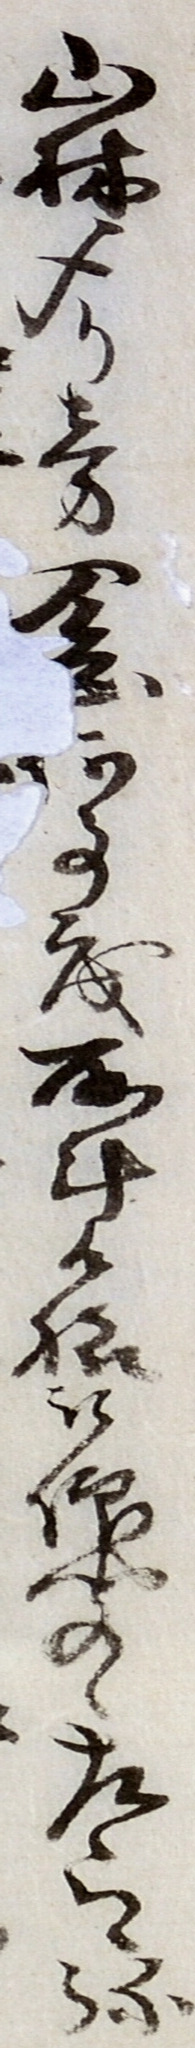山林〆り旁入念何事茂取計候様被仰聞候左候ハヽ弥
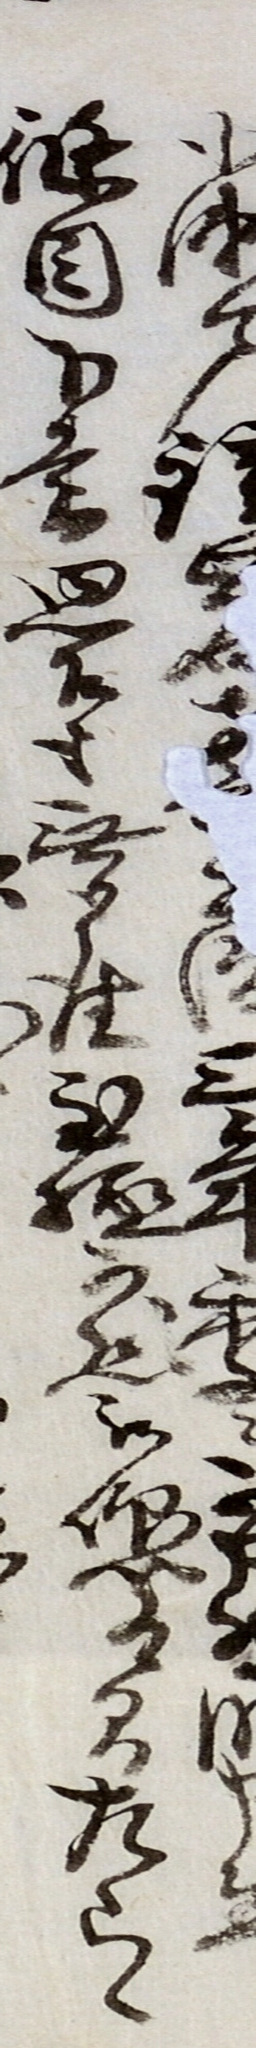一條目下書思召も無御座至極可恐被仰聞候間左候ハヽ
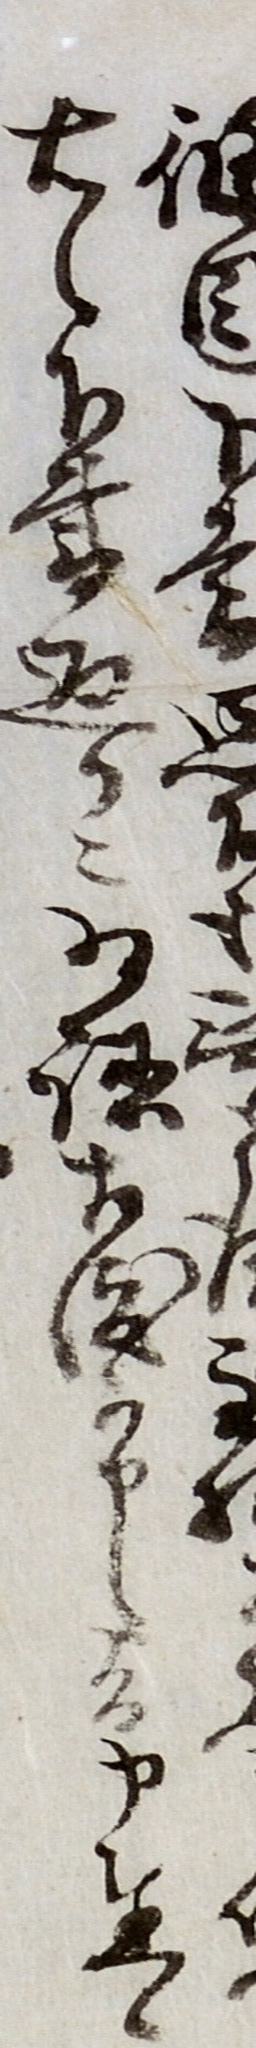右之下書返りニ為認相渡可申候間申達候
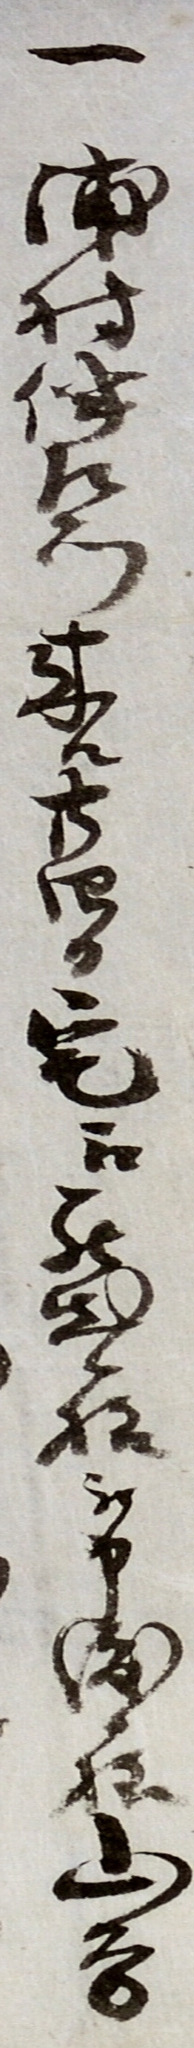一浦村伴左衛門来ル廿四日宅江罷出候様被申渡候様山方
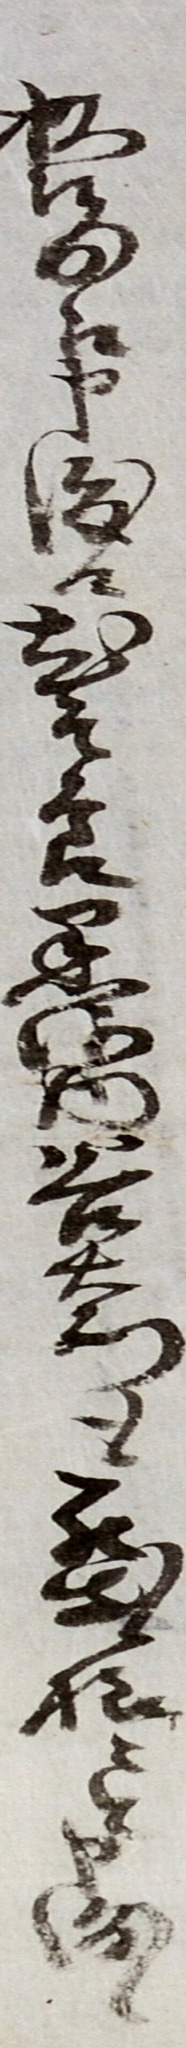杦左衛門江申渡候尤其節黒河内善右衛門も罷出候様ニと申渡候
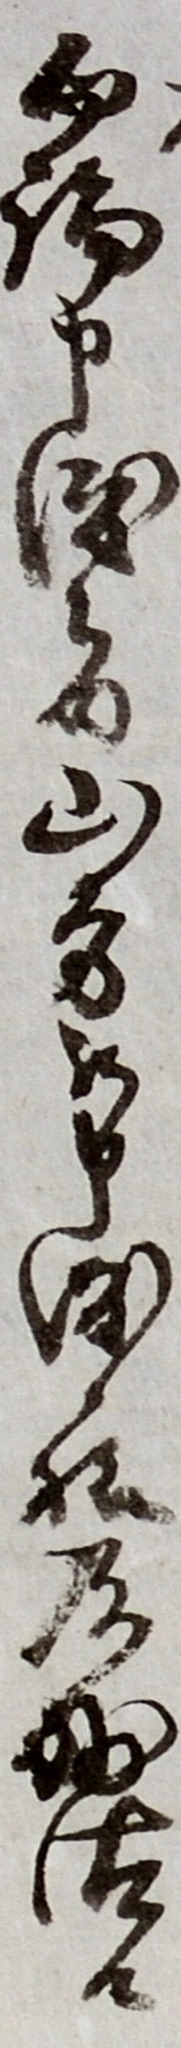勿論申渡候山方被申渡候様及沙汰候
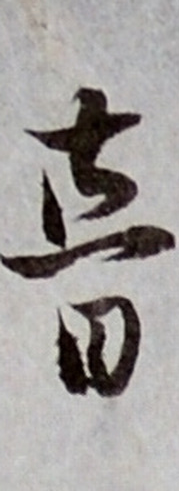十九日
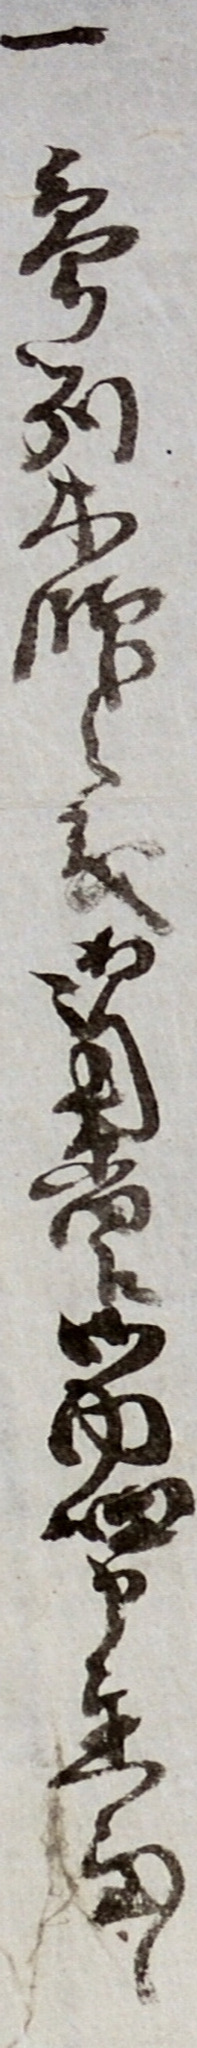一参州木師之義御用番江御内咄申達置候
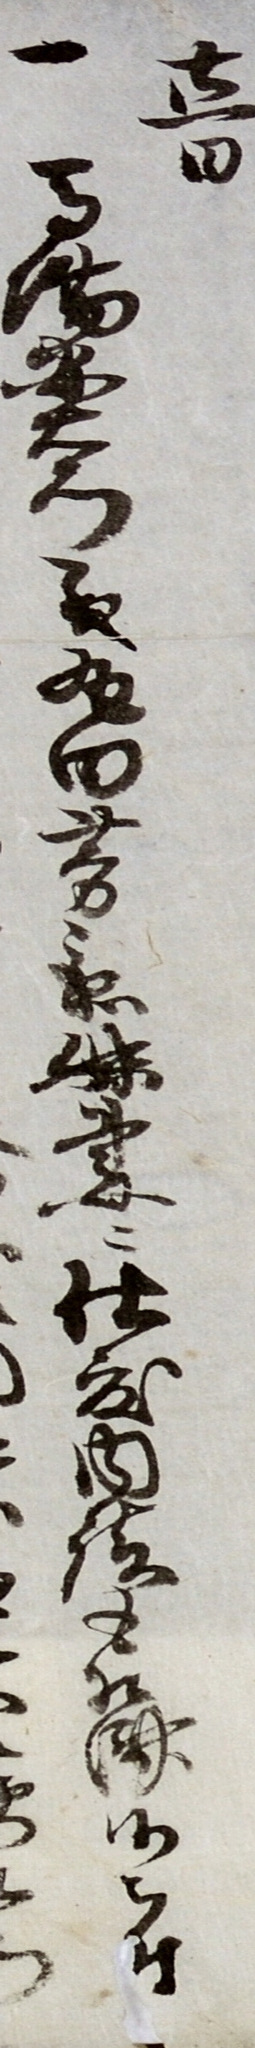一馬場安右衛門義丸田芳兵衛妹妻ニ仕度内談も相済候ニ付
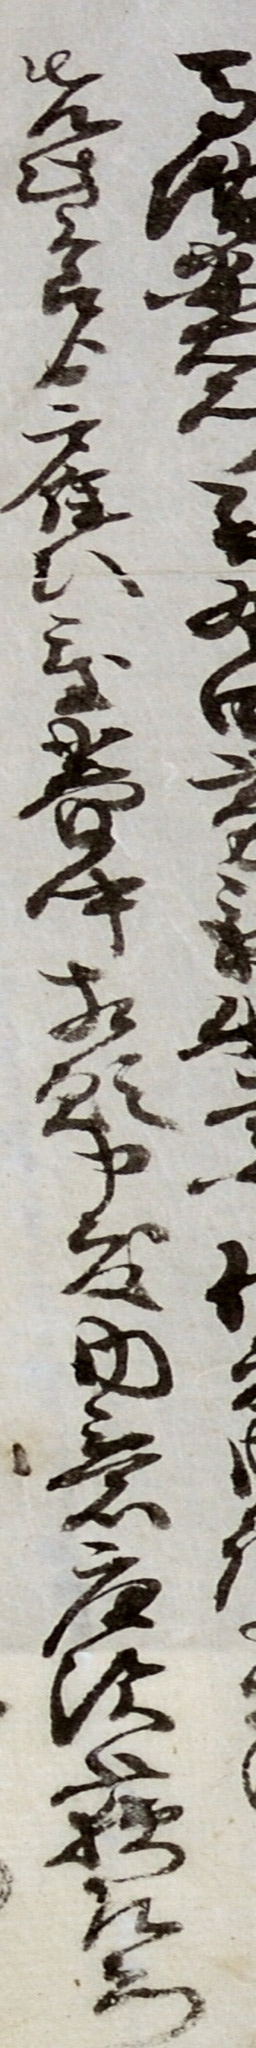先此節ゟ雇ひ置中相願申度内意唐沢萩左衛門
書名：御山奉行御用留
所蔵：伊那市立高遠町図書館・合同会社AMANE
